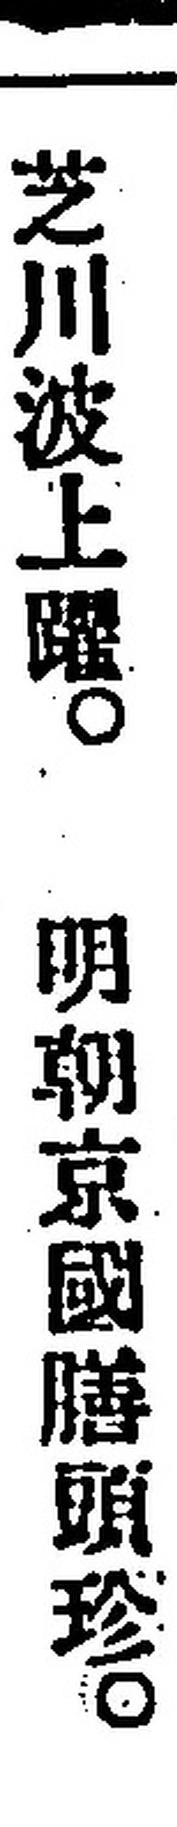芝川波上躍。明朝京国膳頭珍。
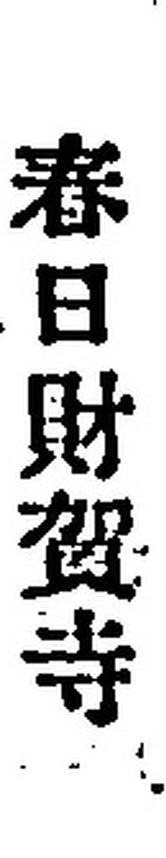春日財賀寺
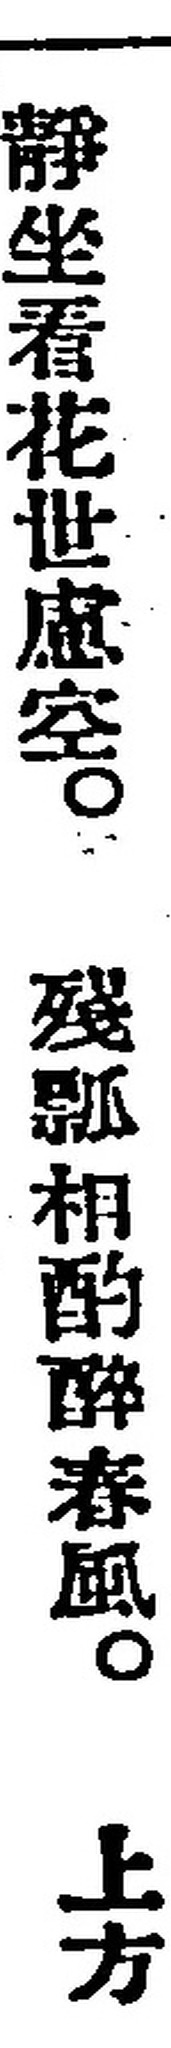静坐看花世慮空。残瓢相酌酔春風。上方
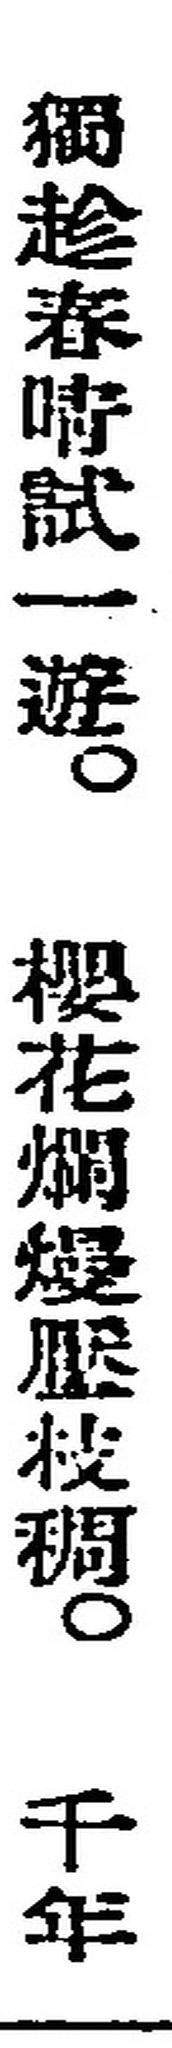独趁春晴試一遊。桜花爛熳圧枝稠。千年
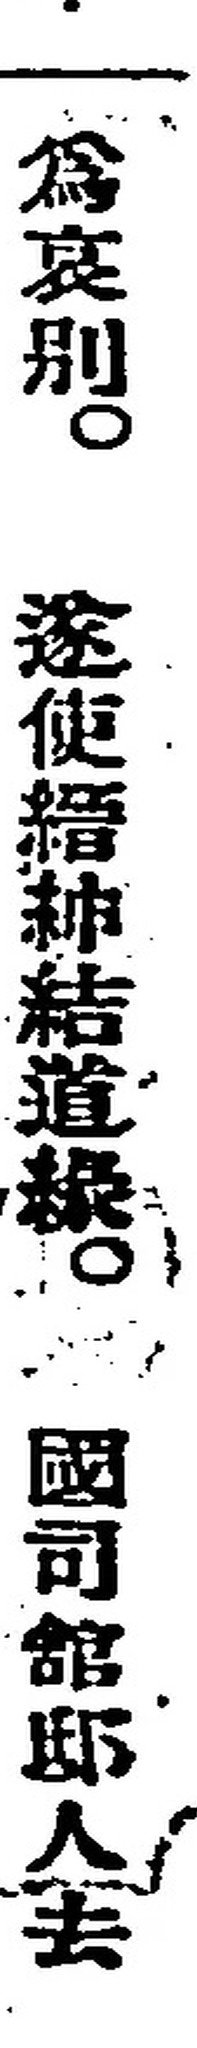為哀別。遂使縉紳結道縁。国司舘邸人去
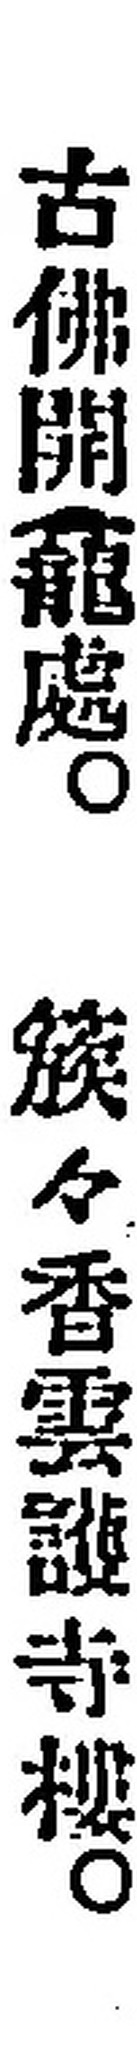古仏開龕処。簇々香雲護寺楼。
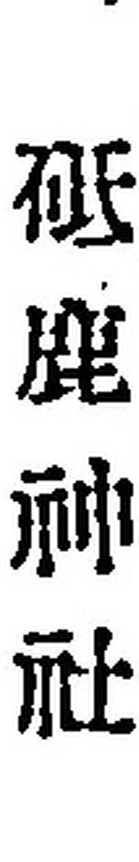砥鹿神社
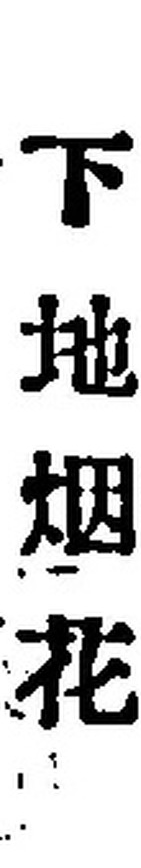下地烟花
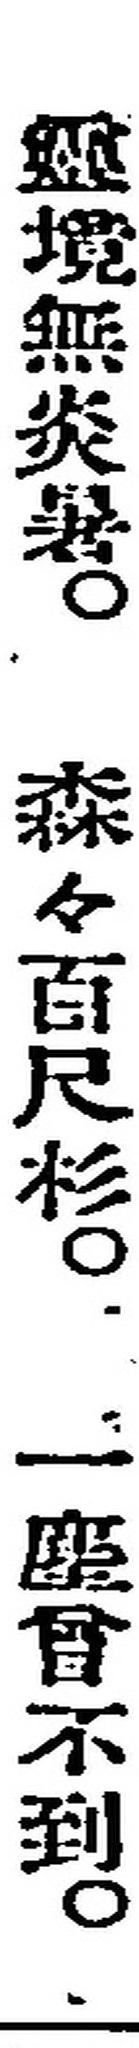霊境無炎暑。森々百尺杉。一塵曽不到。
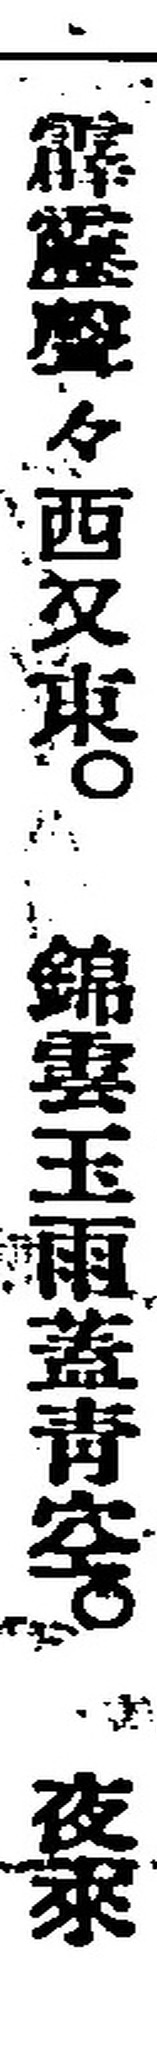霹靂声々西又東。錦雲玉雨蓋青空。夜来
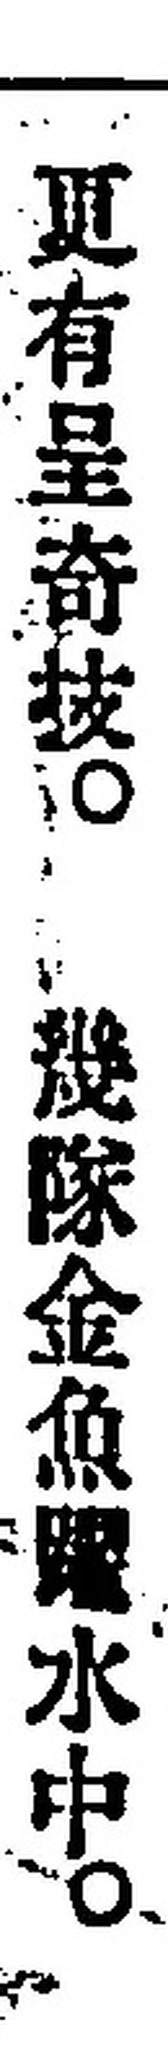更有呈奇技。幾隊金魚躍水中。
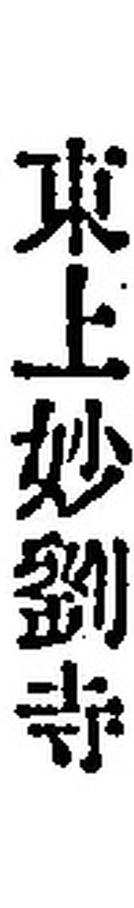東上妙劉寺
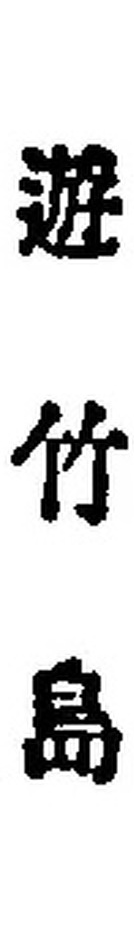遊竹島
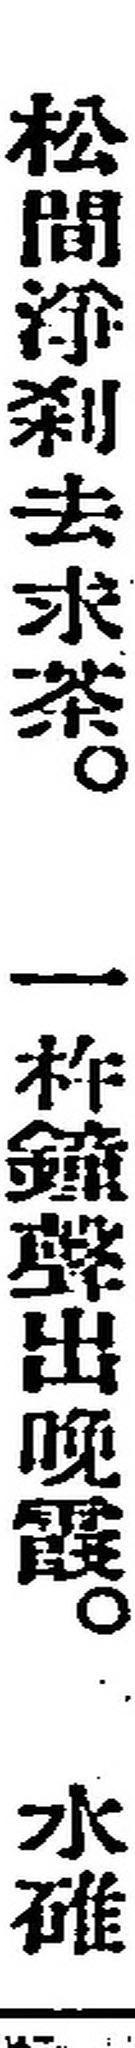松間浄刹去求茶。一杵鐘声出晩霞。水碓
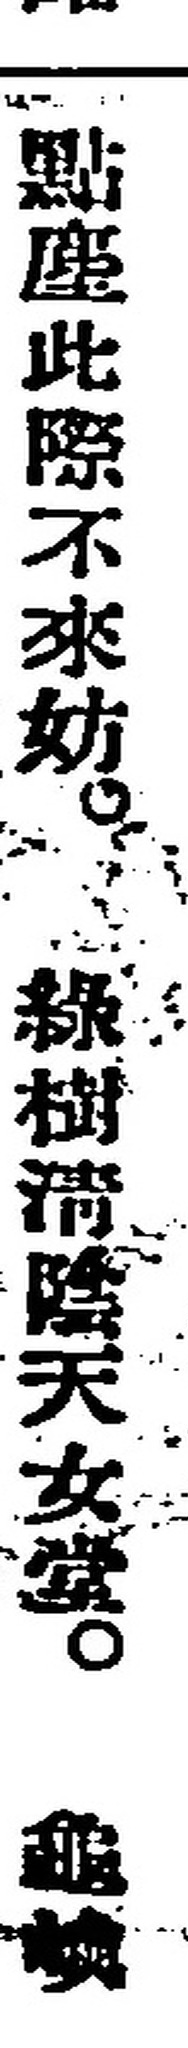点塵此際不来妨。緑樹清陰天女堂。亀嶼
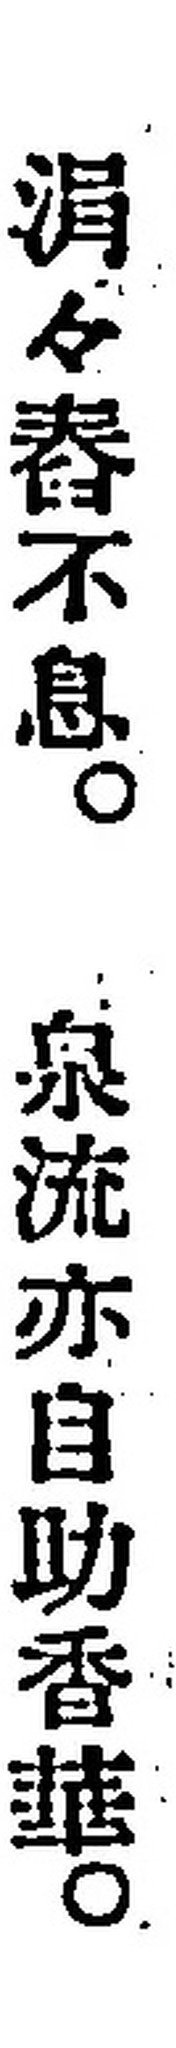涓々舂不息。泉流亦自助香華。
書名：東参名勝案内
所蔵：国立国会図書館 National Diet Library, JAPAN
